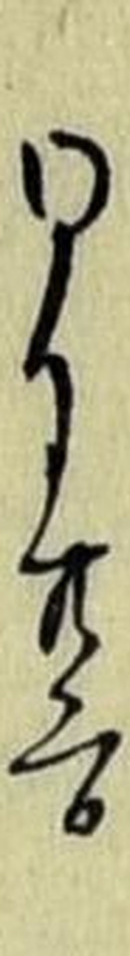七月廿九日
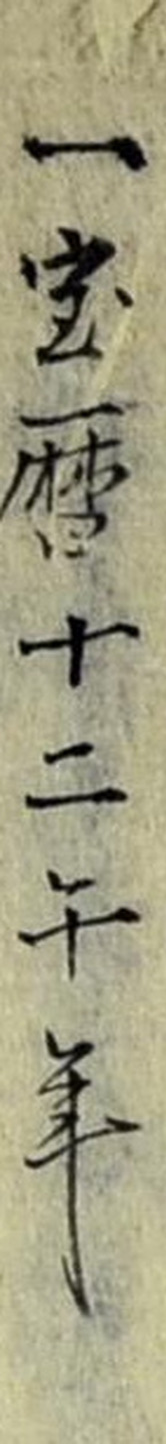一宝暦十二午年
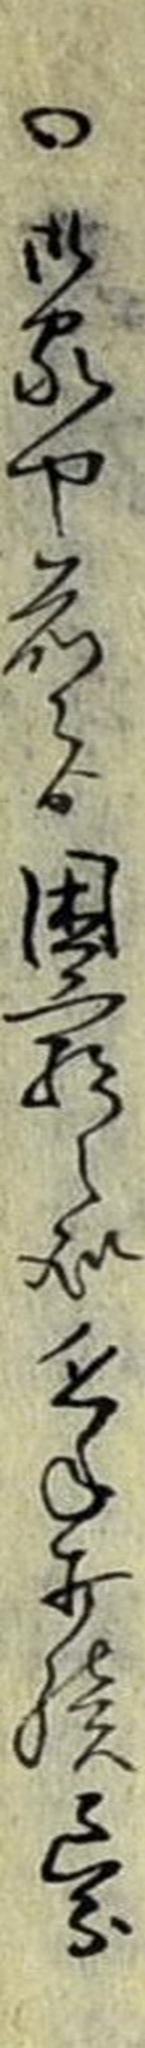〇御家中前々ゟ困窮之処近年打続過分諸月番
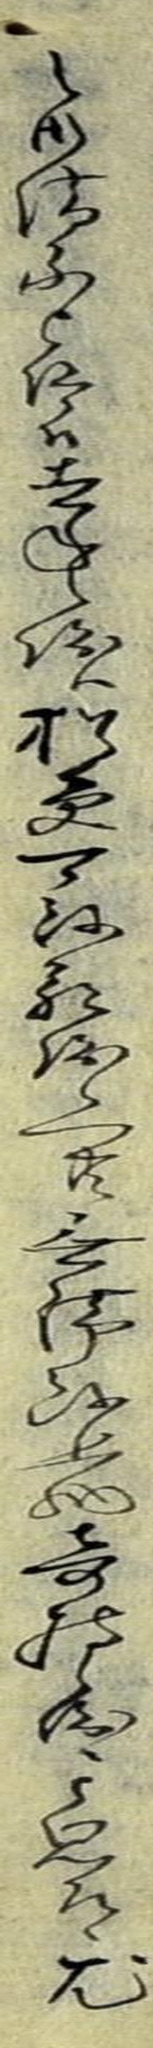之御借米被仰付去年之儀は猶更可致難儀候へ共無滞致上納奇特之儀に被思召候尤
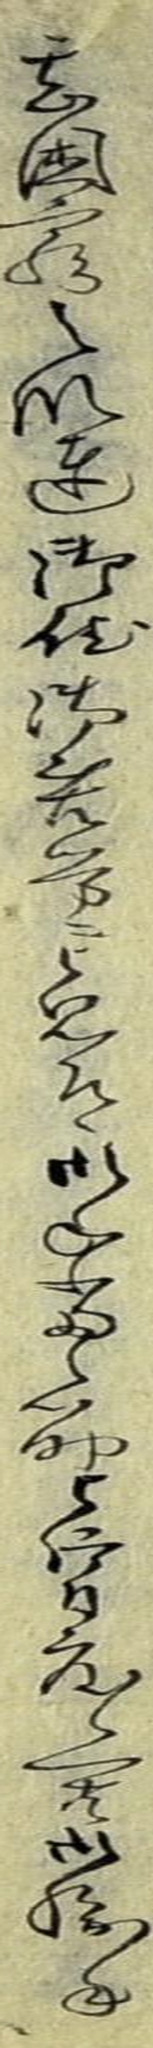其困窮之段達御聴御苦労に被思召候御手当之筋被仰付度候へ共御勝手
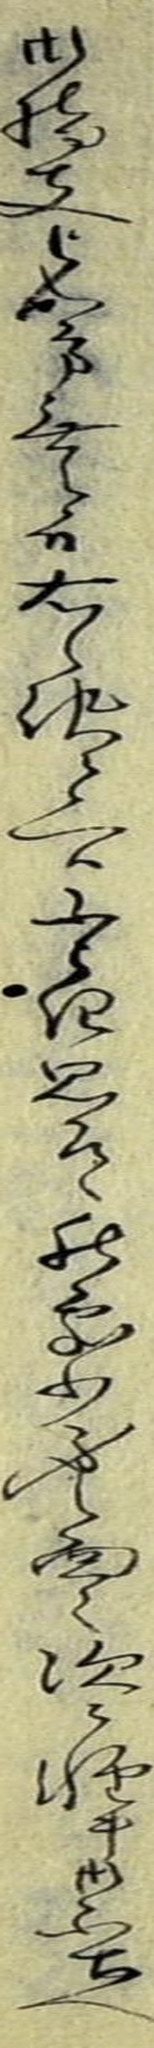御指支被成方無之に付右之訳に候へは不被任思召候然処少身之面々次に軽き御ふち人
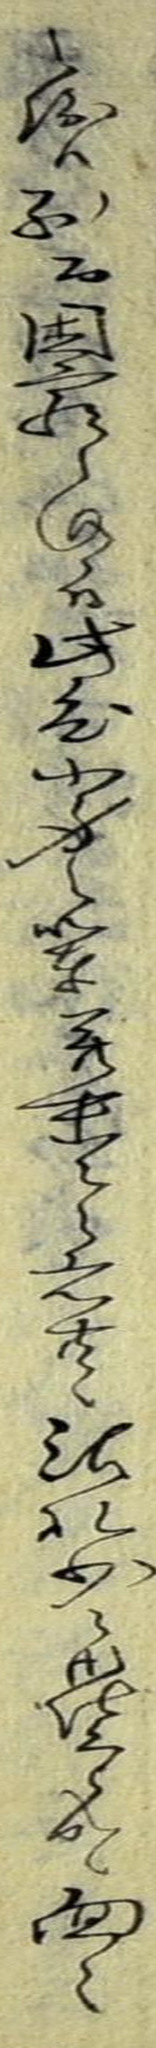之儀は別而困窮之趣に付此度小身之輩并末々之者共へ銀札少々御貸被成候面々

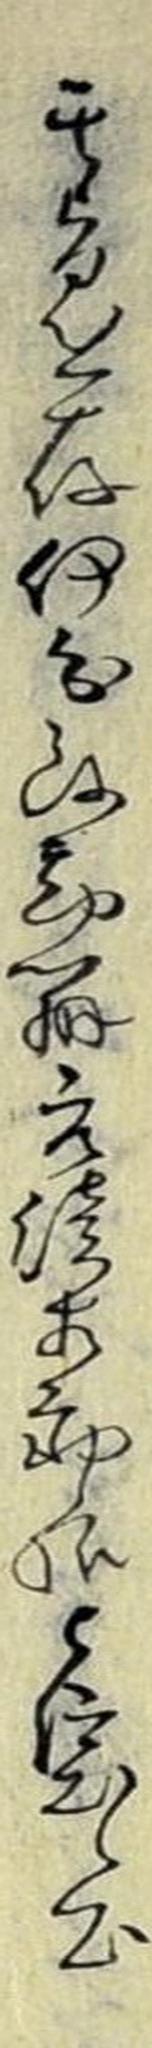其旨を存何分致勘弁取続相勤様被仰出候以上
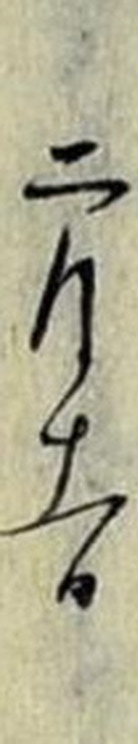二月十一日
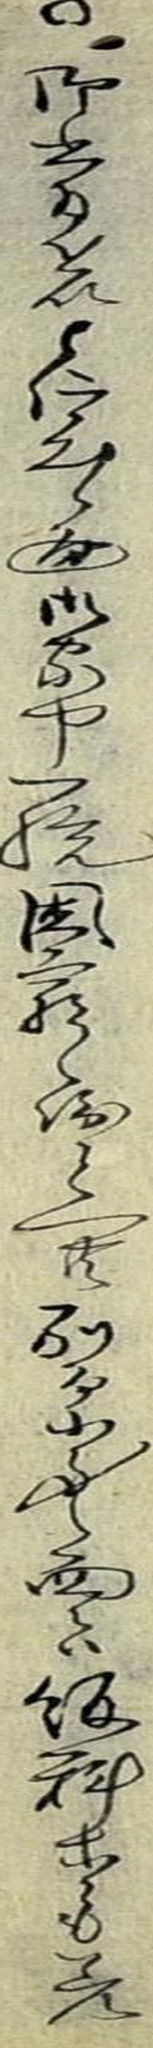〇御書付を以被仰出候通御家中一統困窮之儀に候へ共別而小身之面々は飯料等も差
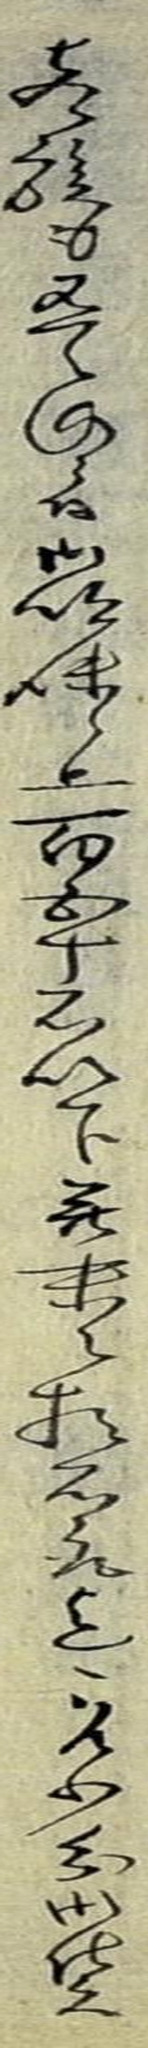支候族も有之趣に付御吟味之上百五十石以下并末々拾石取迄へ乍少分御貸
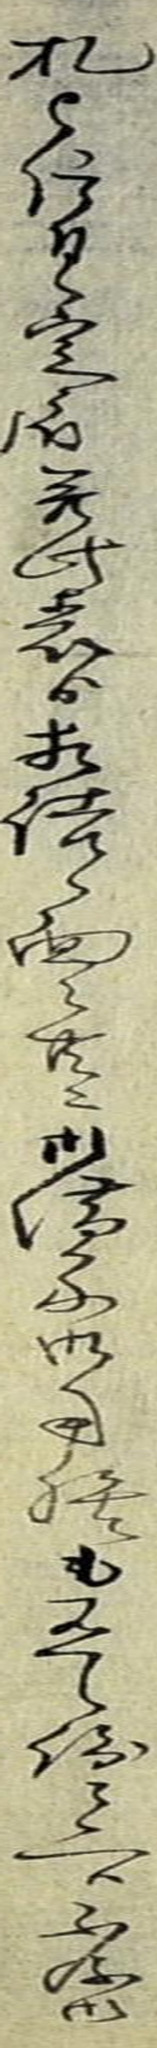札被仰付候定府并此表ゟ相詰候面々共に御借米御用捨も有之儀に候へは不及御
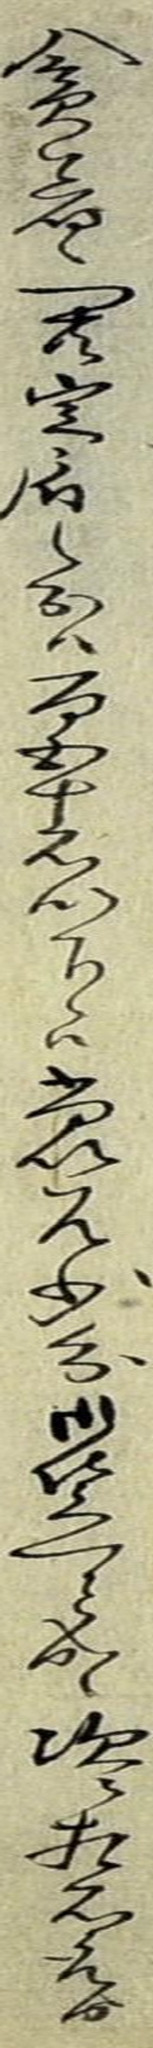貪着候へ共定府之分は百五十石以下へは尚以乍少分御貸可被成候次に拾石取ゟ
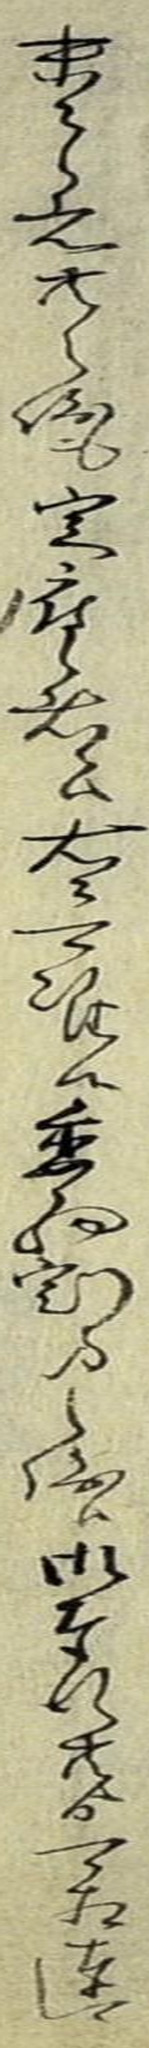末々之者共之儀も定府之者へは右に可准候委細割方之儀は御奉行共ゟ可相達候
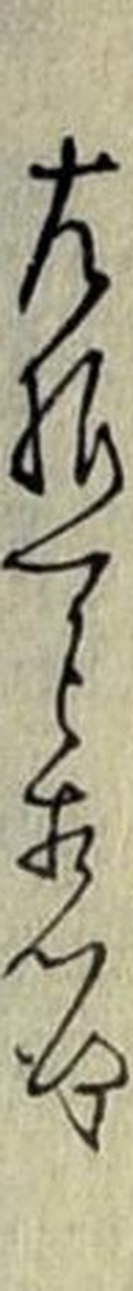左様可被相心得候
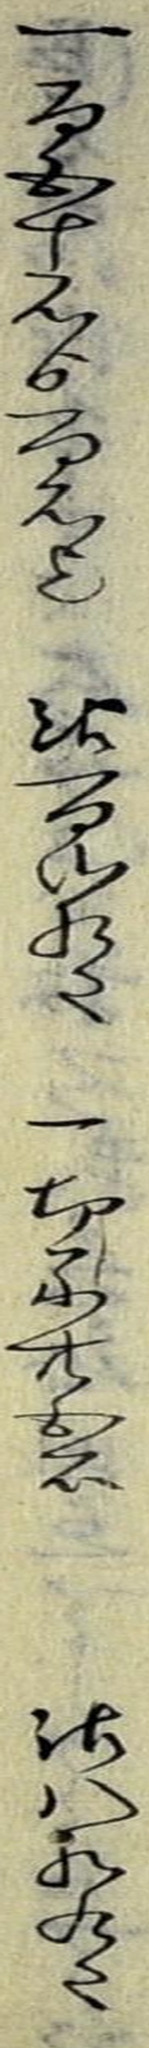一百五十石ゟ百石迄銀百弐拾匁一切米廿五石銀八拾九匁
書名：命令之部 二
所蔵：福井県文書館 Fukui Prefectural Archives
